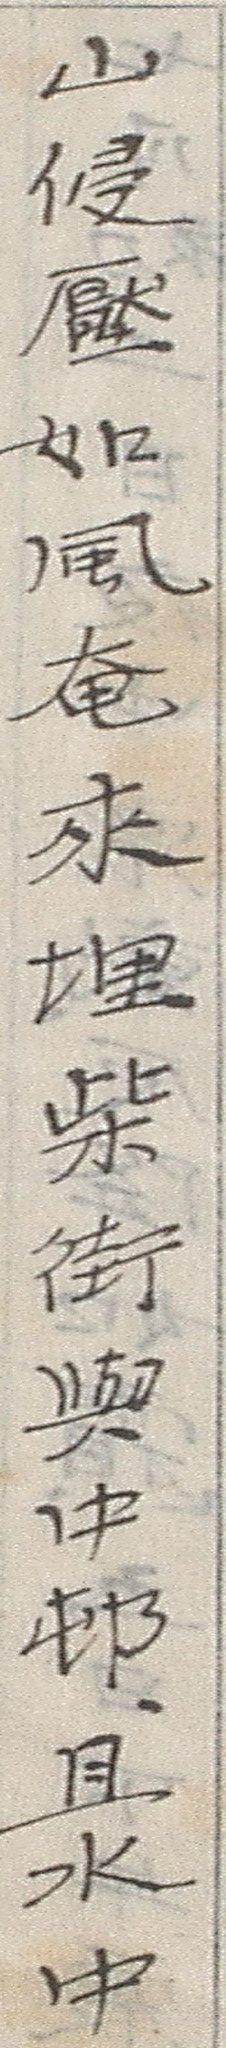山侵圧如風奄来埋柴街與中邨、且水中
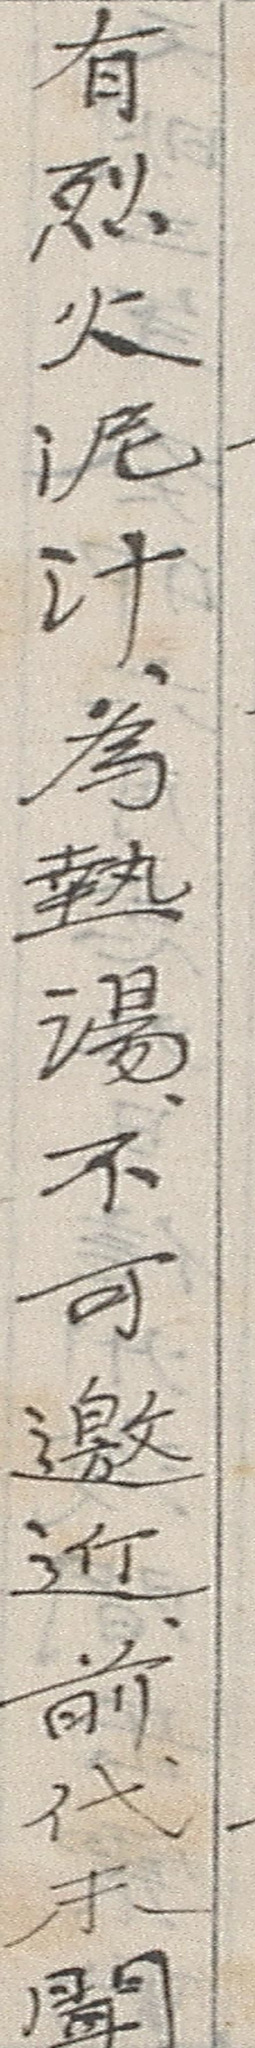有烈火泥汁、為熱湯、不可邀近、前代未聞
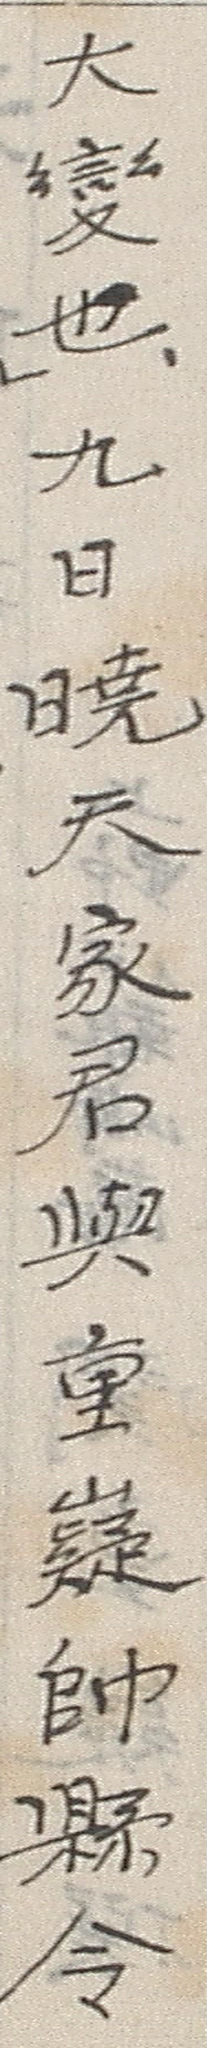大変也、」九日暁天家君與重嶷師縣令
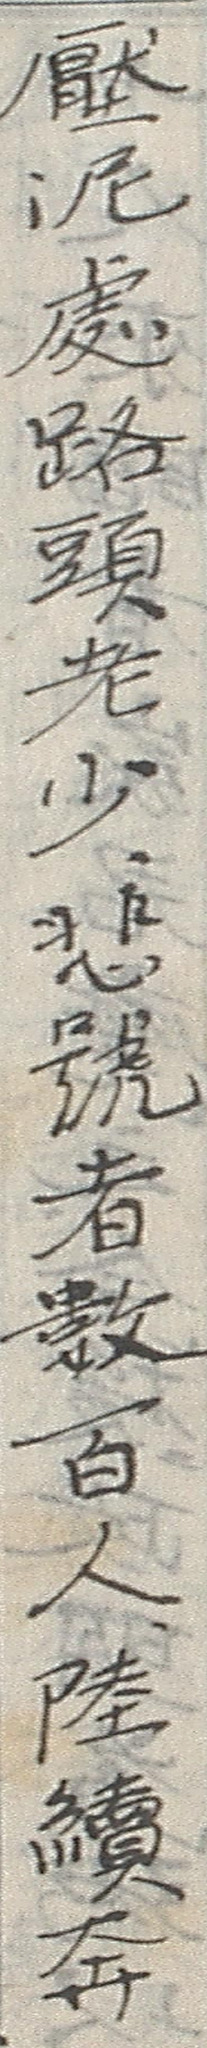圧泥處路頭老少、悲号者数百人、陸続奔
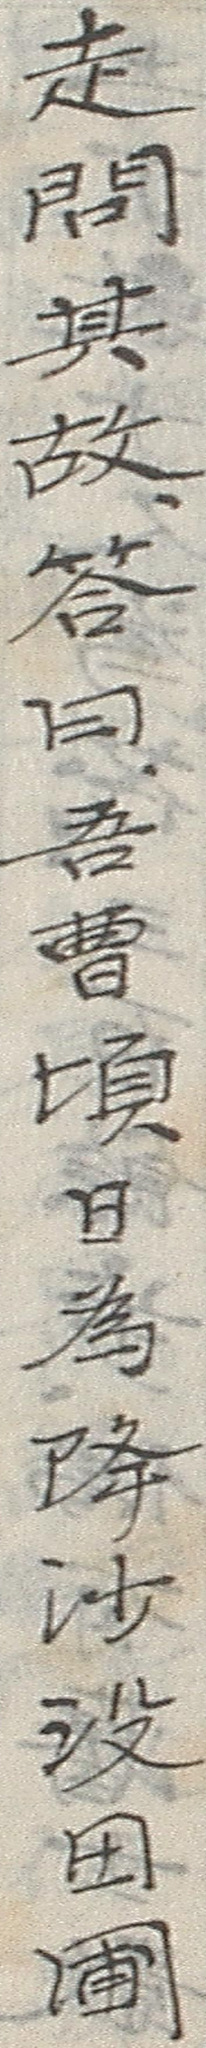走問其故、答曰、吾曹頃日為降沙没田圃
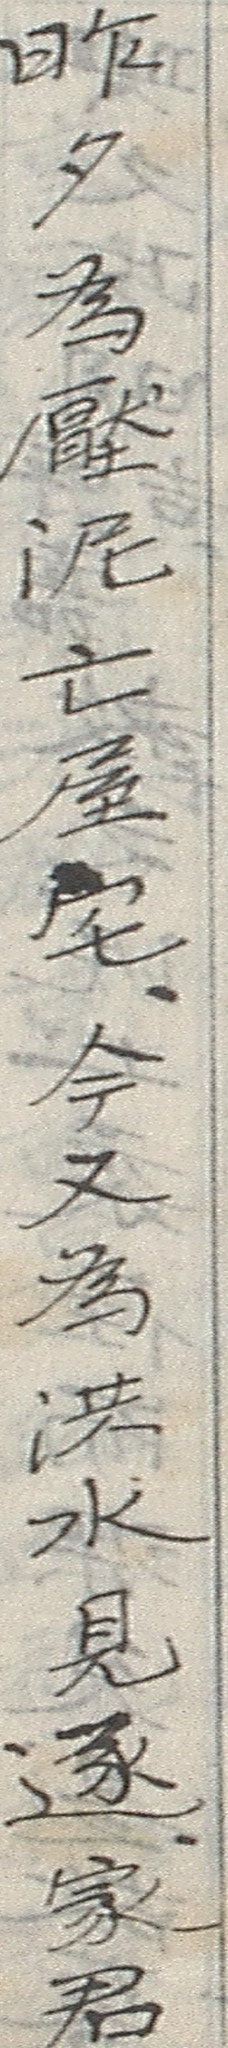昨夕為圧泥亡屋宅、今又為洪水見遂、家君
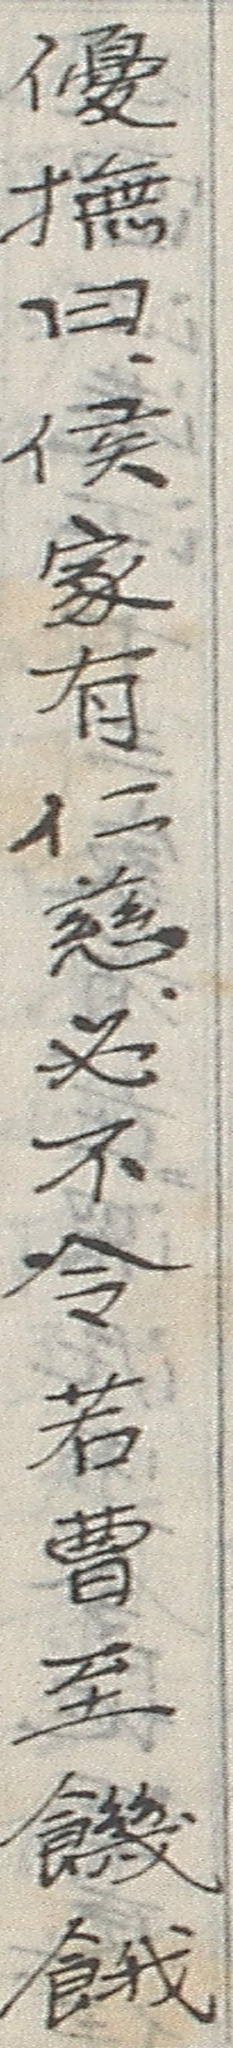優撫曰、候家有仁慈、必不令若曹至飢餓
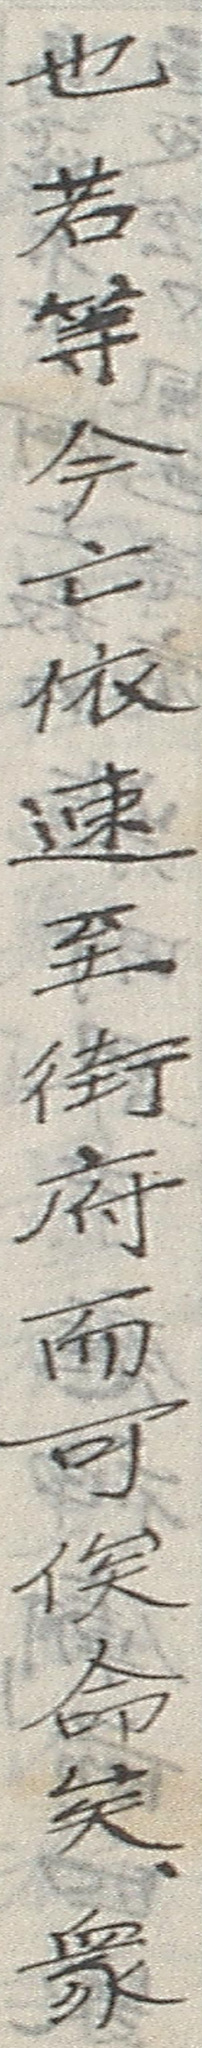也若等今亡依速至街府而可俟命矣、衆
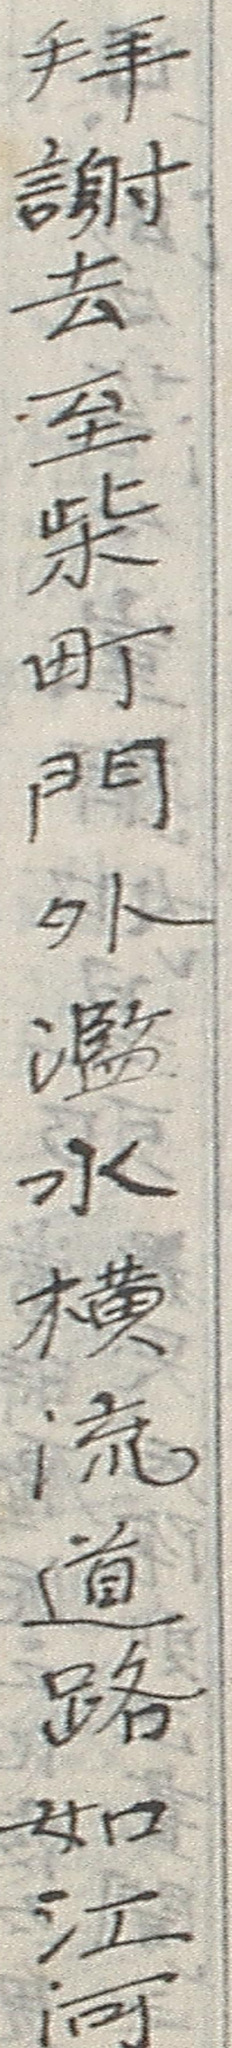拝謝去至柴町門外濫水横流道路如江河
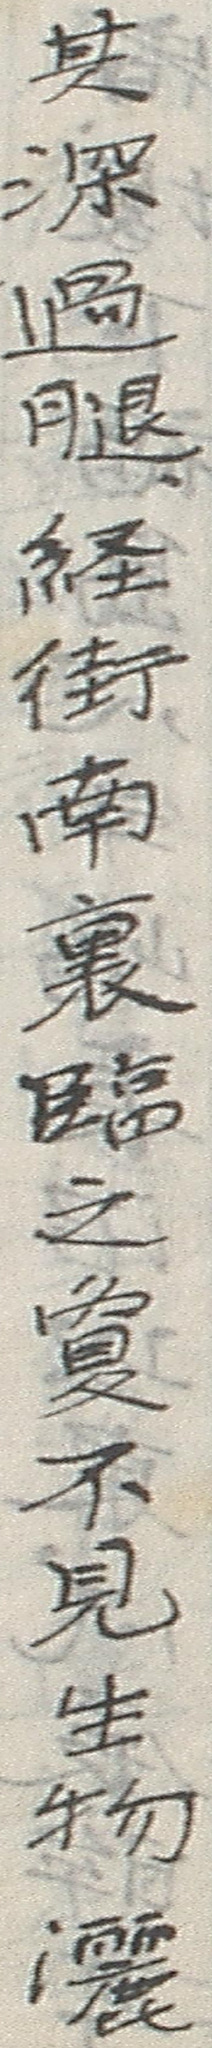其深過腿、経街南裏臨之夐不見生物灑
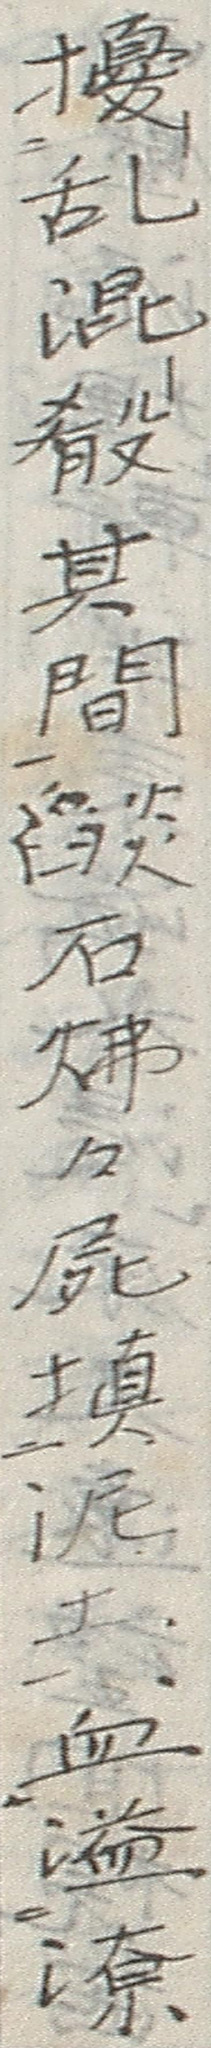擾乱混殽其間焔石々屍填泥土、血溢潦

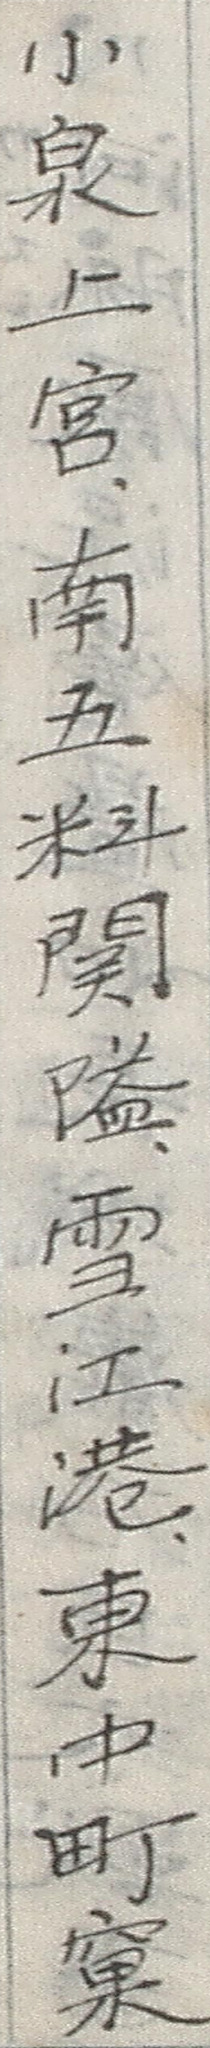小泉上宮、南五料関隘、雪江港、東中町窠
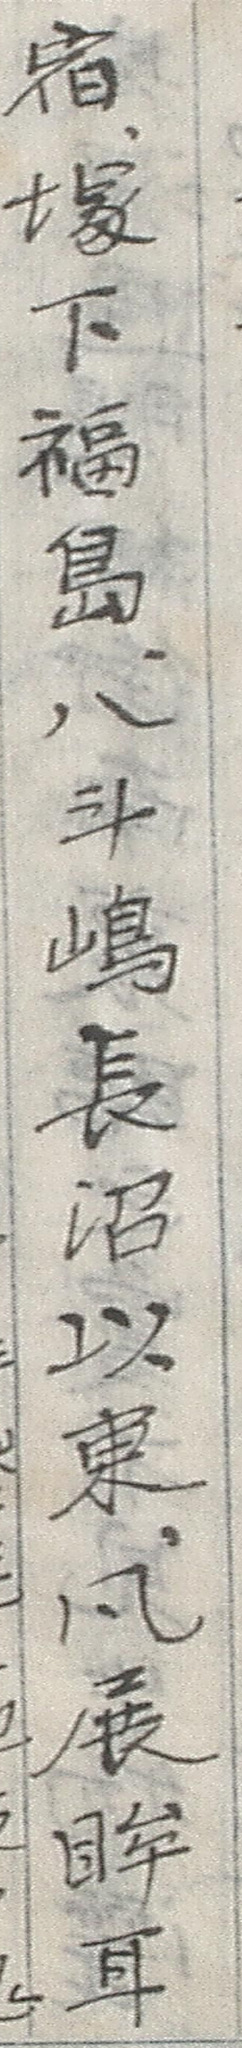宿、塚下福島、八斗嶋長沼以東、凡展眸耳
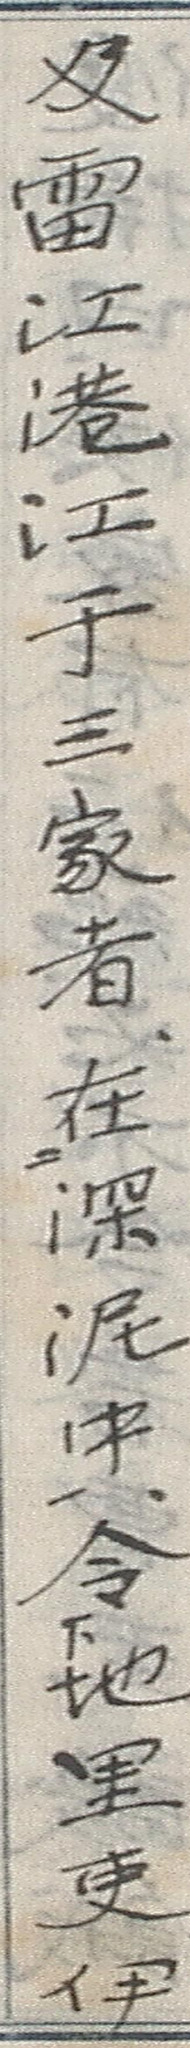及雷江港江于三家者、在深泥中、令地里吏、伊
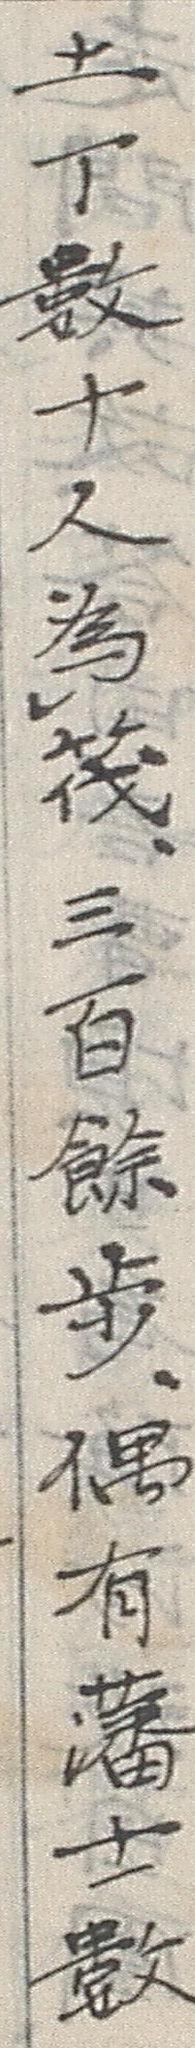土丁数住人為筏、三百余歩、偶有藩士数
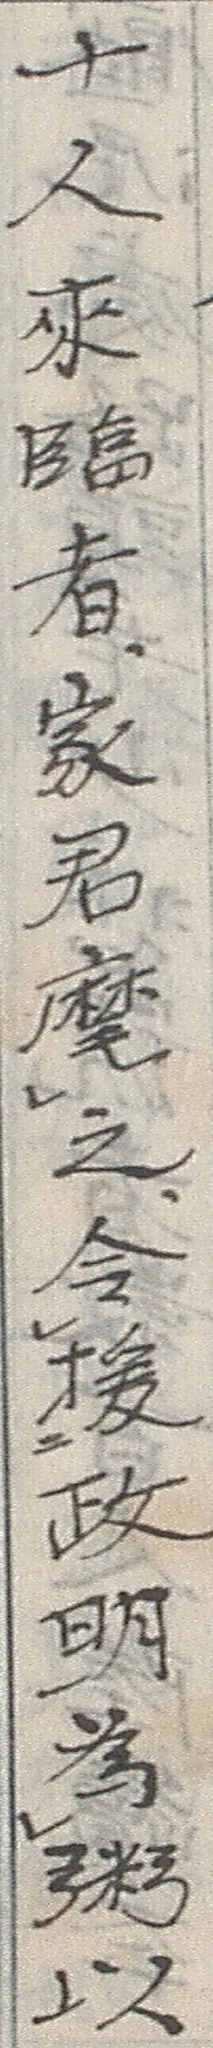十人来臨者、家君摩之、令援政明為粥以
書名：天明三年癸卯六月　沙降記　［蕗原拾続巻之五十二］
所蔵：東京大学地震研究所図書室 Earthquake Research Institute Library, The University of Tokyo, JAPAN
